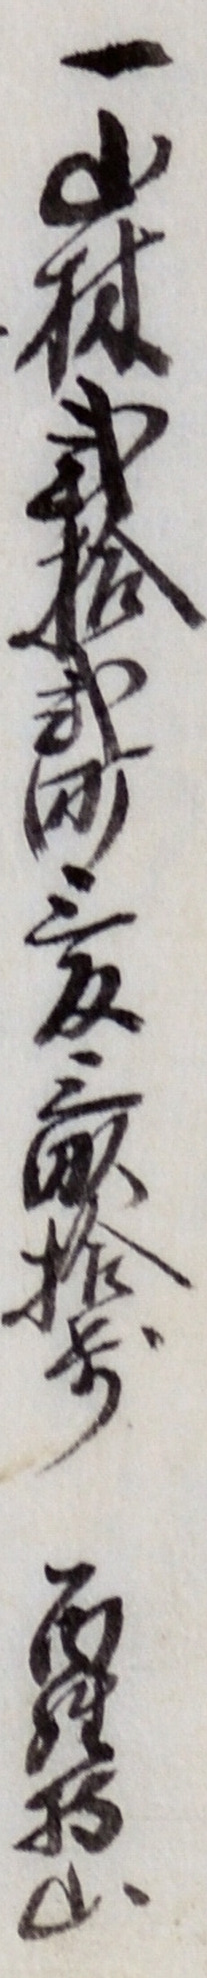一山林弐拾弐町三反三畝拾歩百姓持山
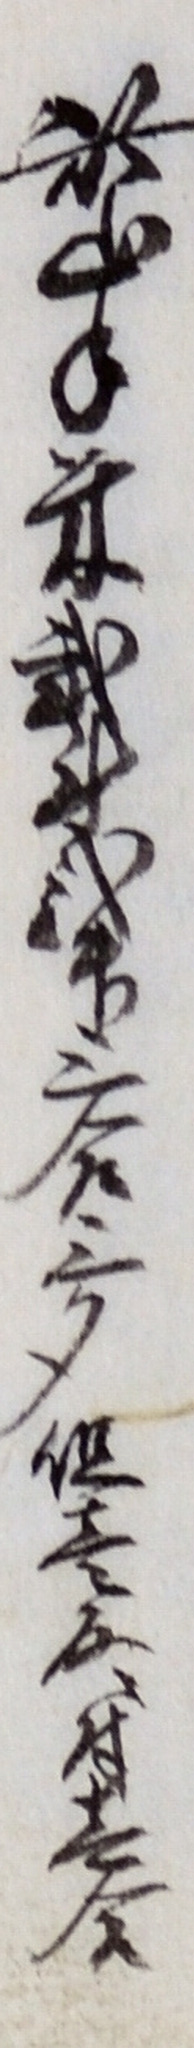此山手米弐斗弐升三合三勺但壱反ニ付壱合
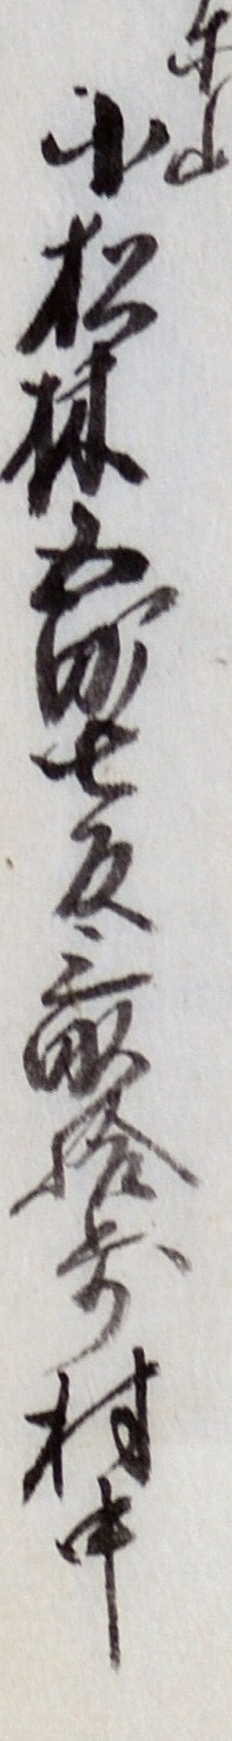小松林五町七反三畝拾歩村中
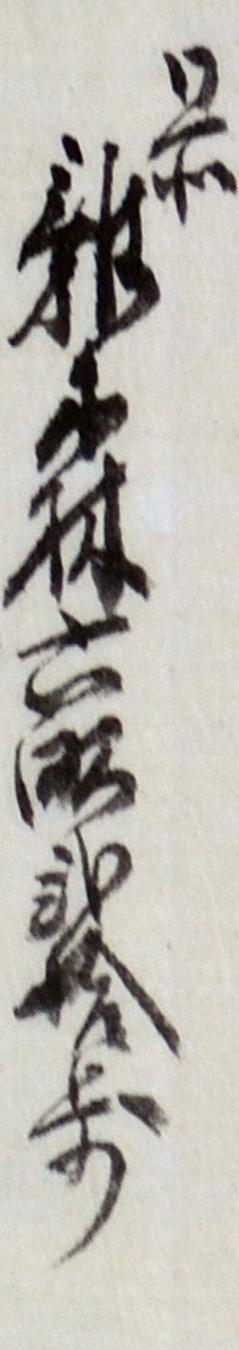雑木林六畝弐拾歩
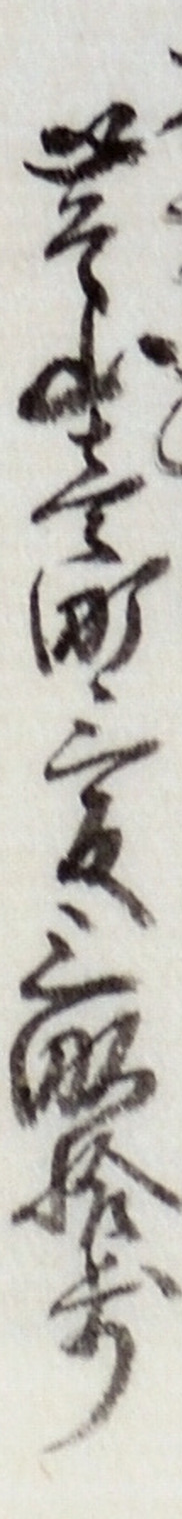芝山壱町三反三畝拾歩同断
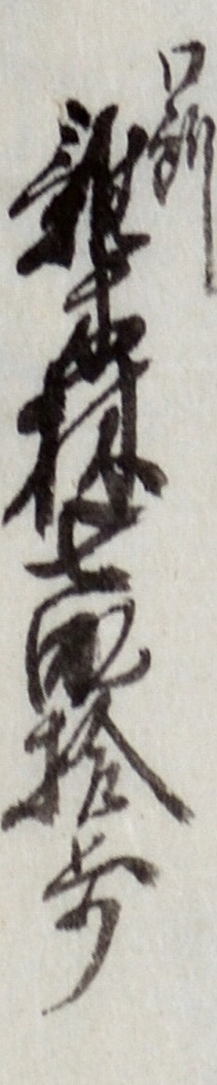雑木林六畝弐拾歩
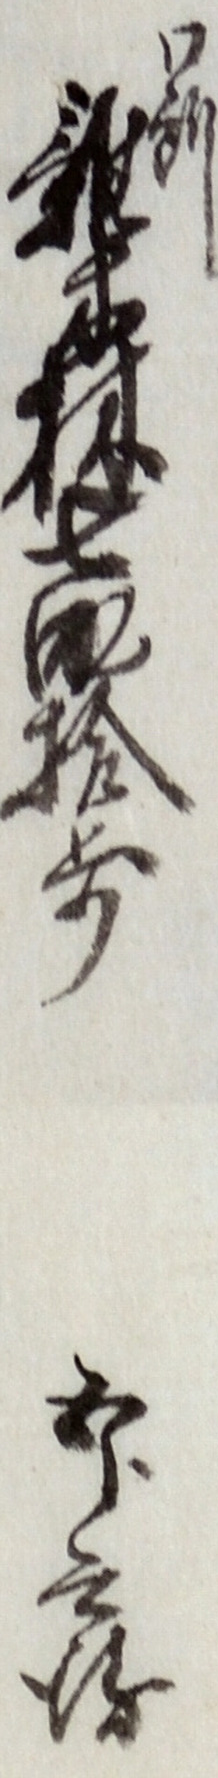雑木林七畝拾歩五郎兵衛
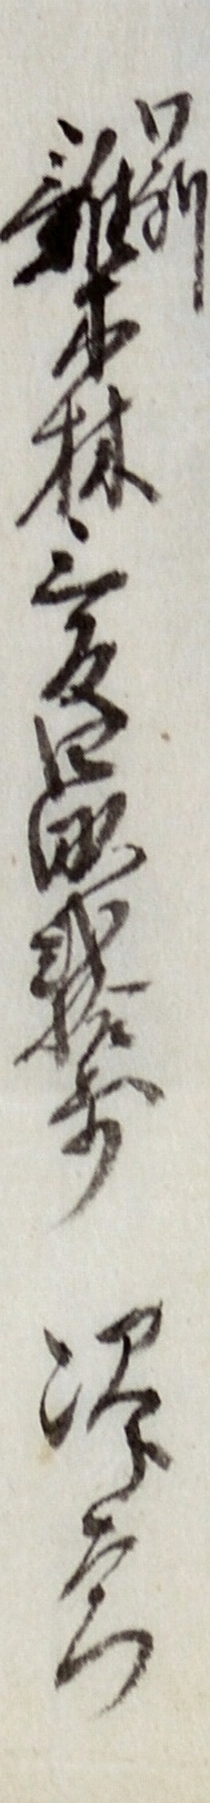雑木林三反四畝弐拾歩次郎右衛門
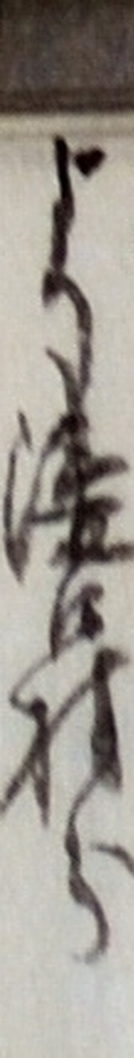より溝口村分
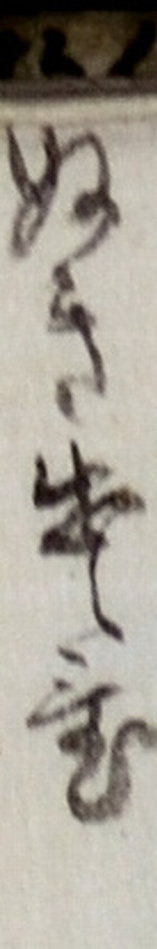ぬき出し置
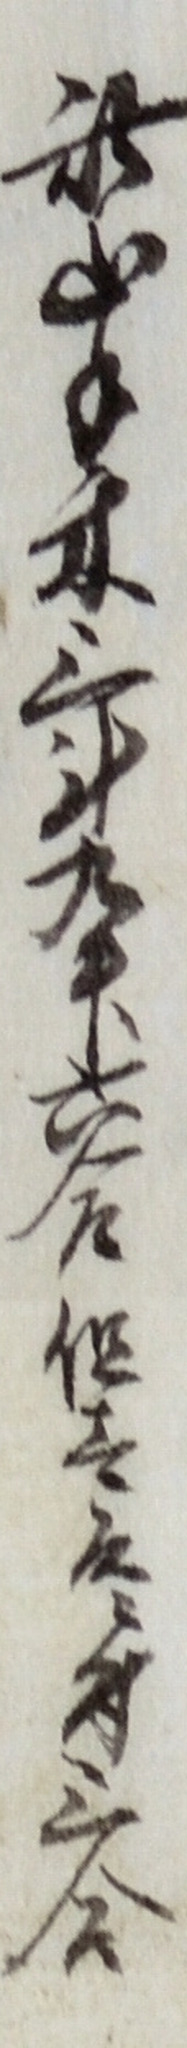此山手米三斗九升六合但壱反ニ付三合

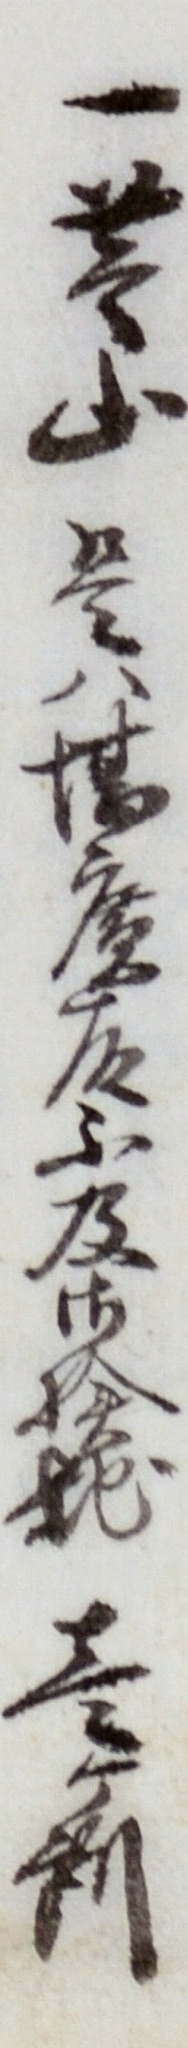一芝山是ハ場広故不及御検地壱ケ所
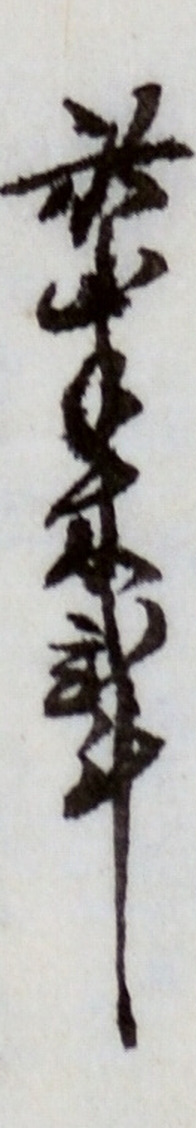此山手米弐斗
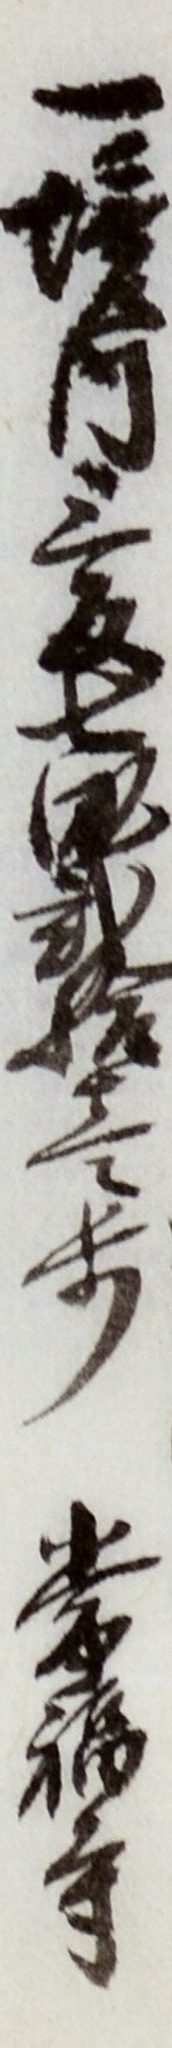一境内三反七畝弐拾壱歩常福寺
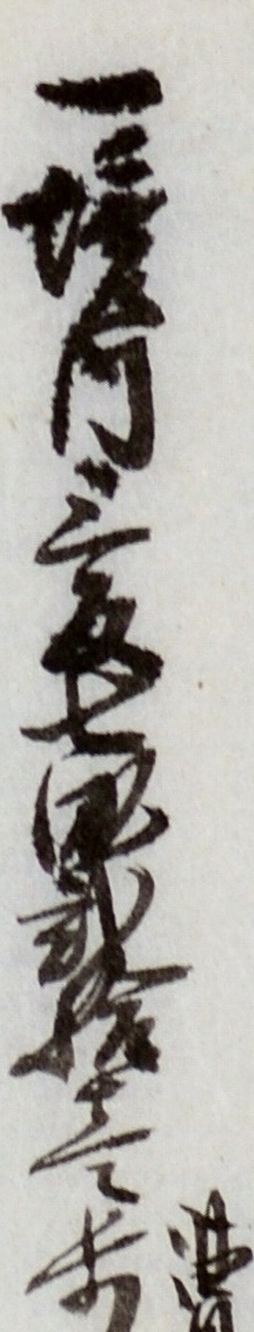一境内三反七畝弐拾壱歩常福寺
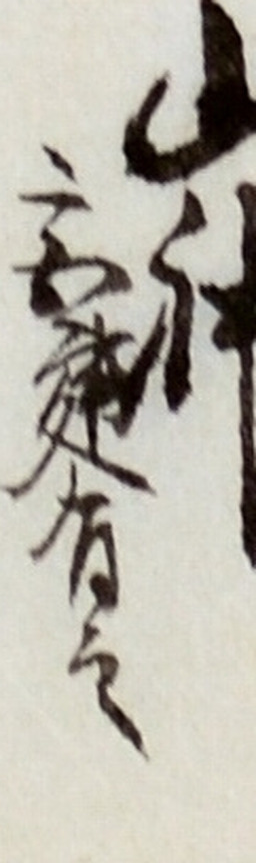宮建有之
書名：御領分中山林社地手控
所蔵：伊那市立高遠町図書館・合同会社AMANE
